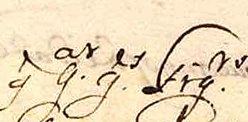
q̄ g.ar g.es Fig.ro
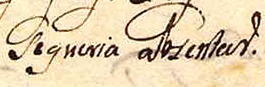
se queria abzentar.
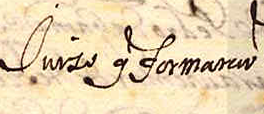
Juizo q̄ formaraõ
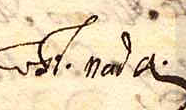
cost. nada.
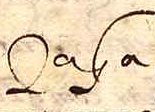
2.a Ta
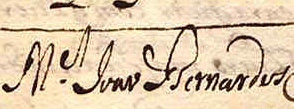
M.el Joaõ Bernardes
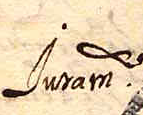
Juramto.
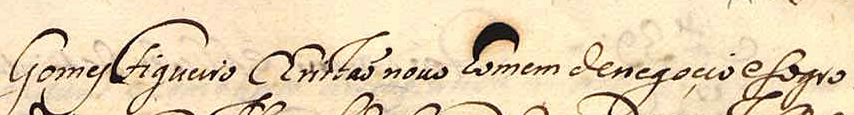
Gomes Figueiro Christaõ nouo homem de negoçio e sogro
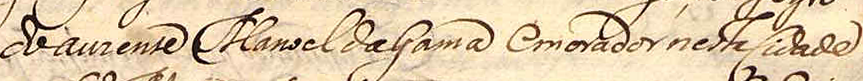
do auzente Manoel da Gama e morador nesta Cidade
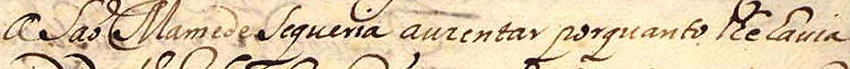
a Saõ Mamede Se queria auzentar porquanto lhe hauia
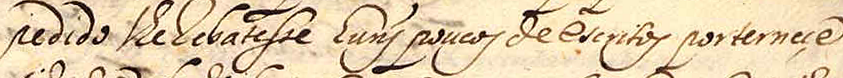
pedido lhe Rebatesse hun̄s poucos de escritos por ter nece
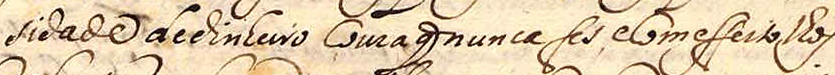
sidade de dinheiro Couza q̄ nunca fes, e Com effeito lhos
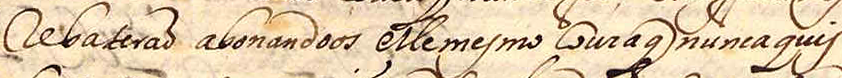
Rebateraõ abonandoos elle mesmo couza q̄ nunca quis
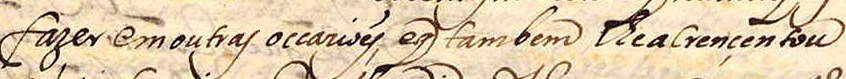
fazer em outras occazioẽs, e q̄ tambem lhe acrencentou
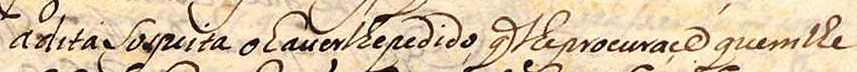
a dita sospeita o hauerlhe pedido, q̄ lhe procurace quem lhe
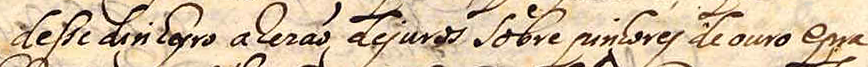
desse dinheyro a Rezaõ de juros sobre pinhores de ouro e pra
